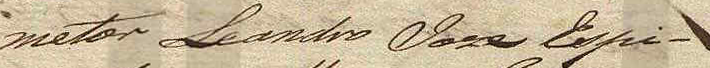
metor Leandro Ioze Espi
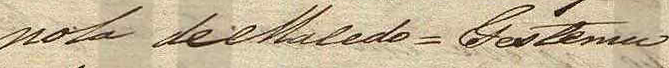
nola de Macedo = Testemu
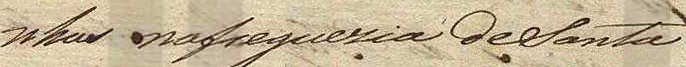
nhas na freguezia de Santa
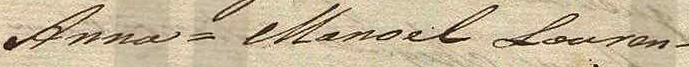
Anna = Manoel Louren
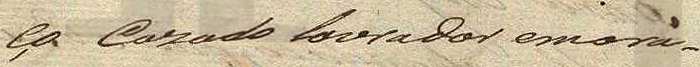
ço cazado lavrador e mora
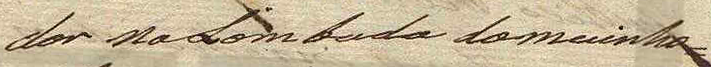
dor na Lombada do muinho
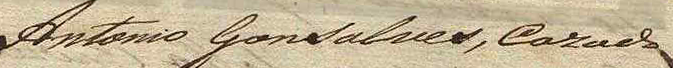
Antonio Gonsalves, cazado
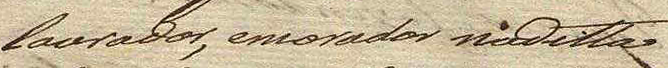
lavrador, e morador na ditta
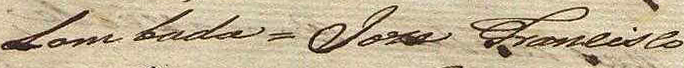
lombada = Joze Francisco
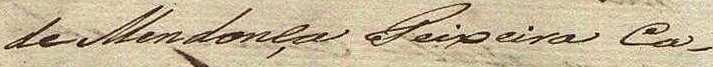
de Mendonça Teixeira ca
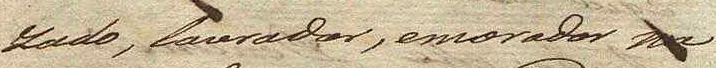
zado, lavrador, e morador na
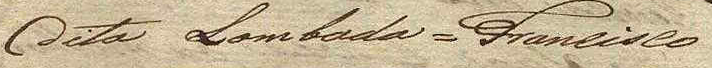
dita Lombada = Francisco
